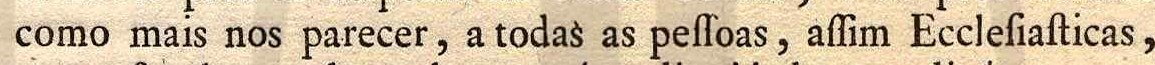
como mais nos parecer, a todas as pessoas, assim Ecclesiasticas,
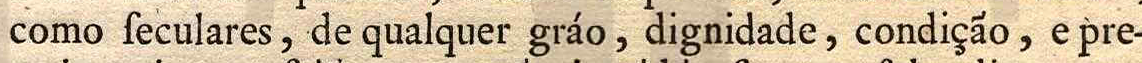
como seculares, de qualquer gráo, dignidade, condição, e pre
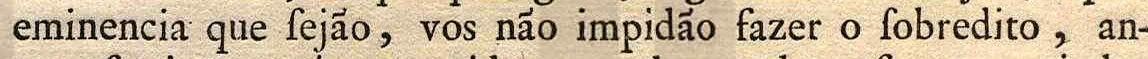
eminencia que sejão, vos não impidão fazer o sobredito, an
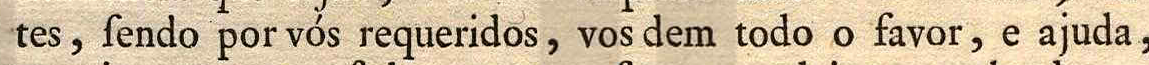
tes, sendo por vós requeridos, vos dem todo o favor, e ajuda,
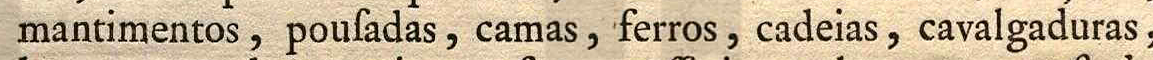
mantimentos, pousadas, camas, ferros, cadeias, cavalgaduras,
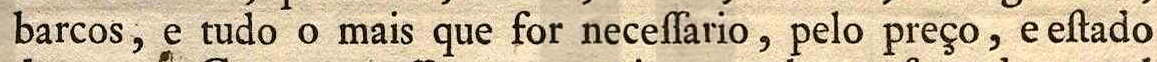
barcos, e tudo o mais que for necessario, pelo preço, e estado
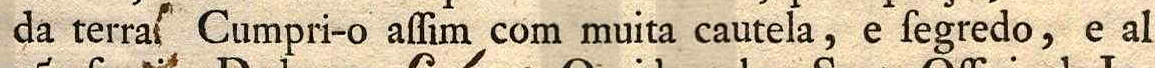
da terra Cumpri-o assim com muita cautela, e segredo, e al
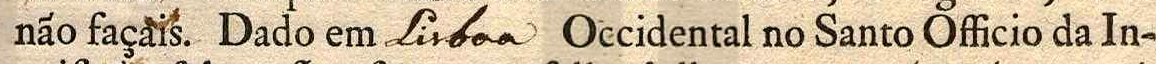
não façais. Dado em Lisboa Occidental no Santo Officio da In
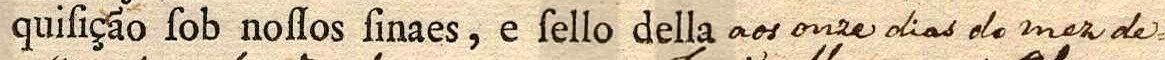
quisição sob nossos sinaes, e sello della aos onze dias do mez de
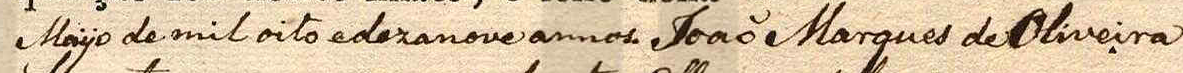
Mayo de mil oito e dezanove annos. Ioaõ Marques de Oliveira
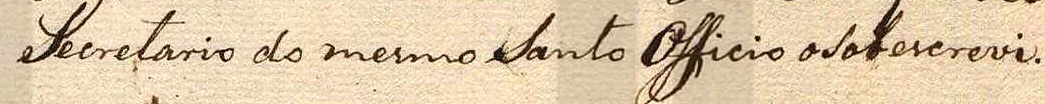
Secretario do mesmo Santo Officio o sobescrevi.
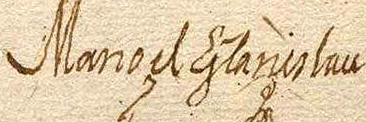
Manoel Estanislau
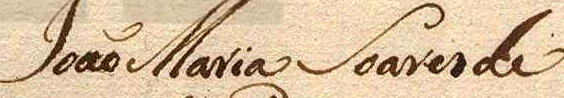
Ioaõ Maria Soares de
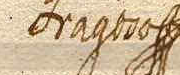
Fragoso
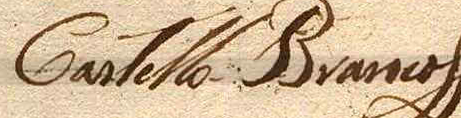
Castello-Branco
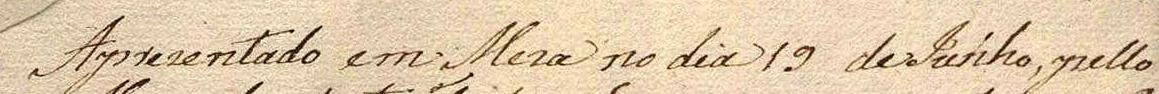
Aprezentado em Meza no dia 19 de Iunho, pello
